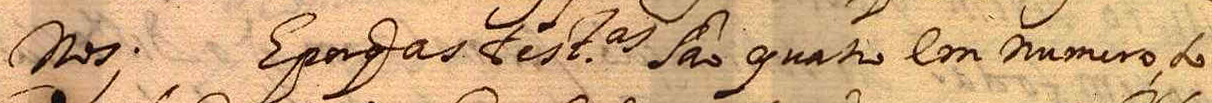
nos; E porq̄ as test.as são quatro em numero, to
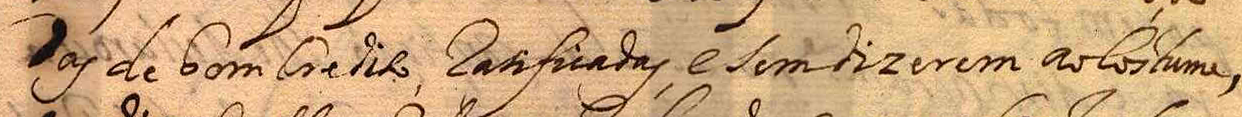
das de bom credito, Ratificadas, e sem dizerem ao Costume,
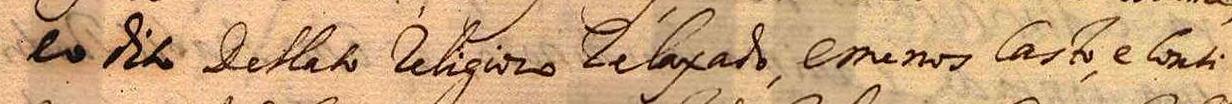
e o dito Dellato Religiozo Relaxado, e menos Casto, e Conti
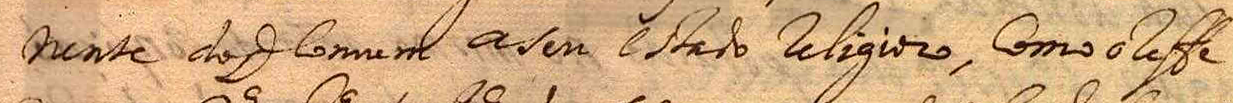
nente do q̄ Conuem a seu estado Religiozo, Como o Reffe
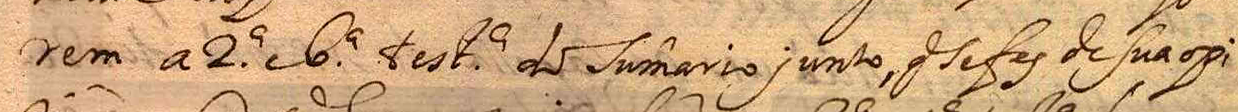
rem a 2.a e 6.a test.a do Sum̄ario junto, q̄ se fes de sua opi
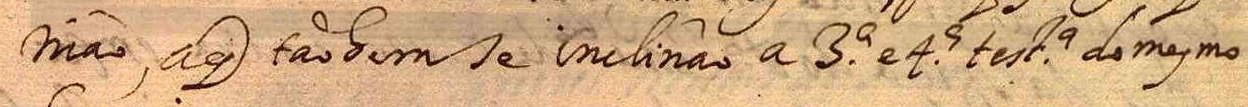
nião, a q̄ taõbem se inclinão a 3.a e 4.a test.a do mesmo
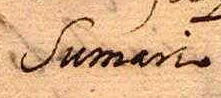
Sumario
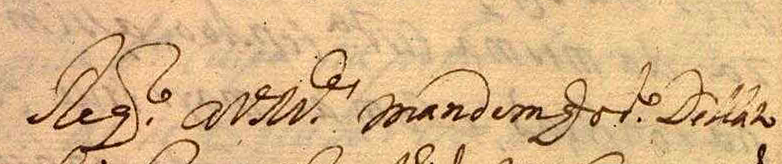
Req.Ro a V M.ces mandem q̄ o d.o Dellato
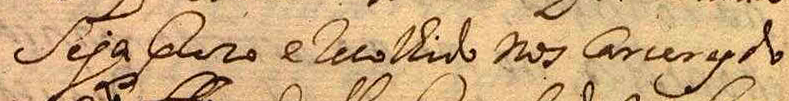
Seja prezo e Recolhido nos Carceres do
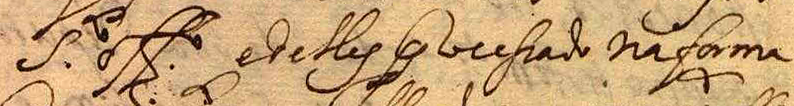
S.to off.o e delles processado na forma
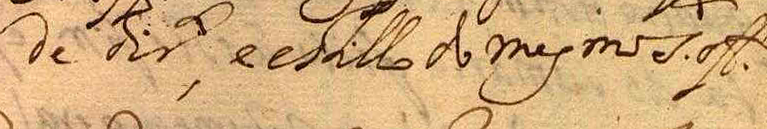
de dirto, e estillo do mesmo s.to off.o
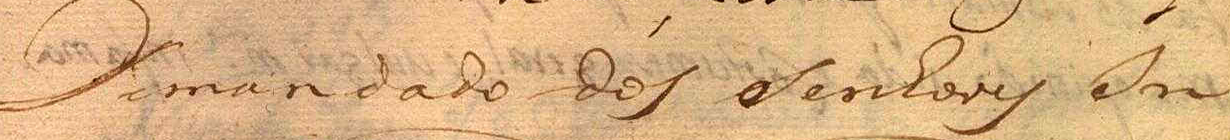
De mandado dos Senhores In
